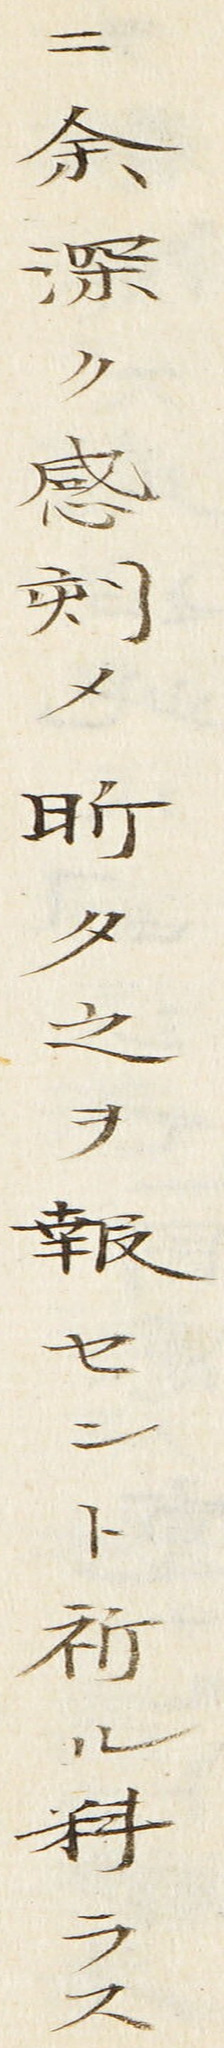ニ余深ク感刾シテ昕夕之ヲ報セント祈ル料ラス
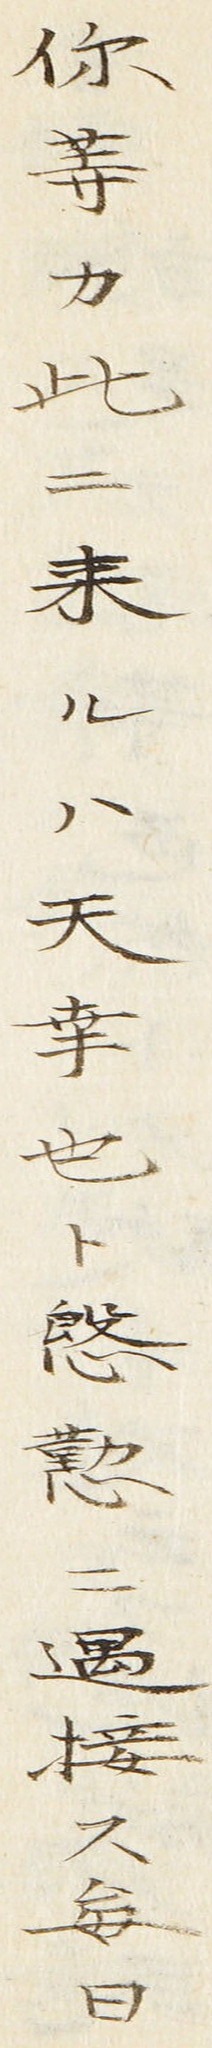你等カ此ニ来ルハ天幸也ト慇懃ニ遇接ス毎日
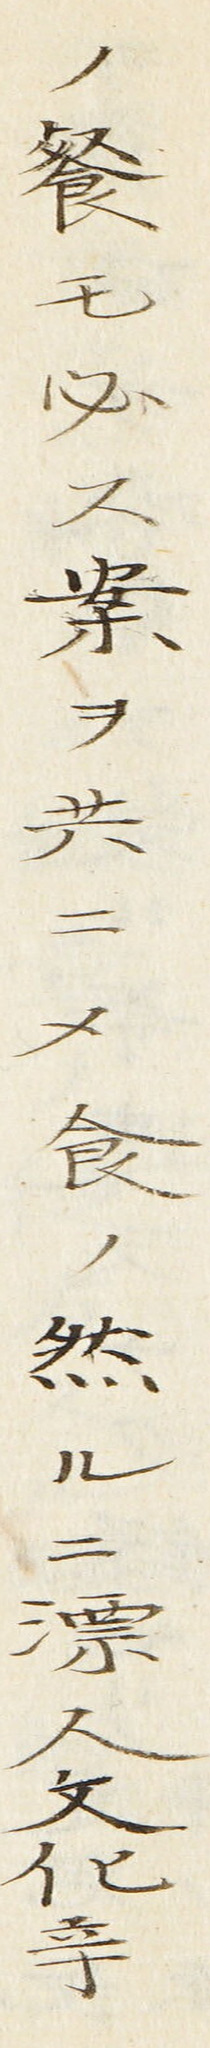ノ餐モ必ス案ヲ共ニシテ食ノ然ルニ漂人文化辛
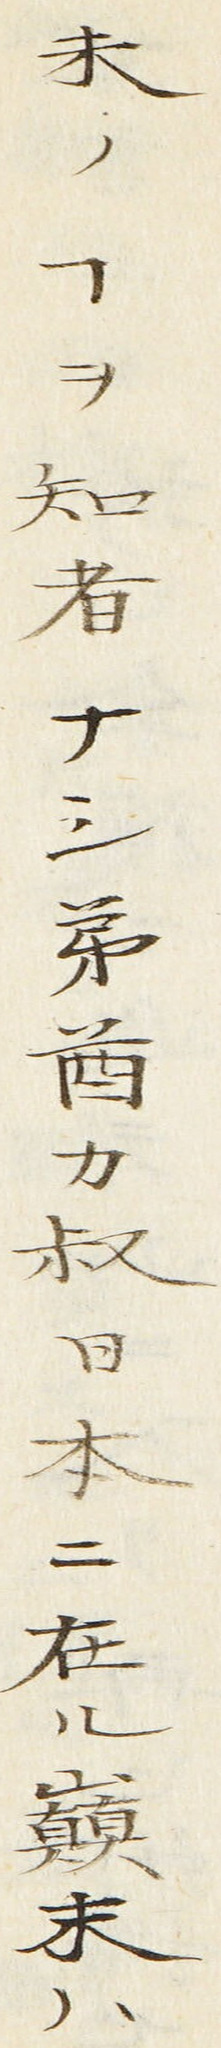未ノコトヲ知者ナシ弟酋カ叔日本二在ル巓末ハ
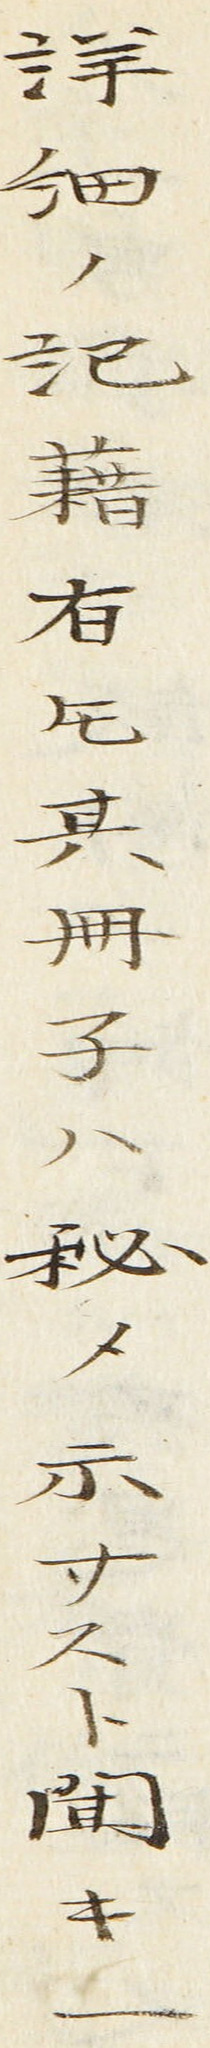詳細ノ記籍有トモ其冊子ハ秘シテ示サスト聞キ一
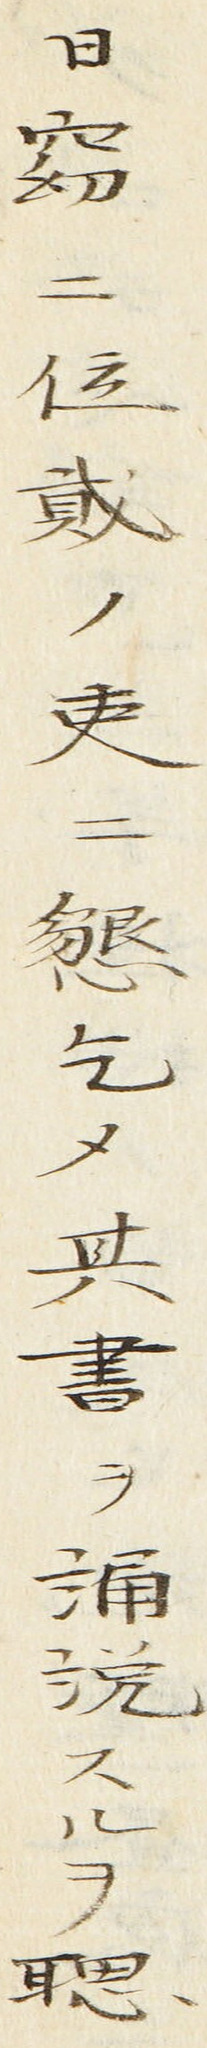日窈ニ位貮ノ吏ニ懇乞シテ其書ヲ誦説スルヲ𦖻

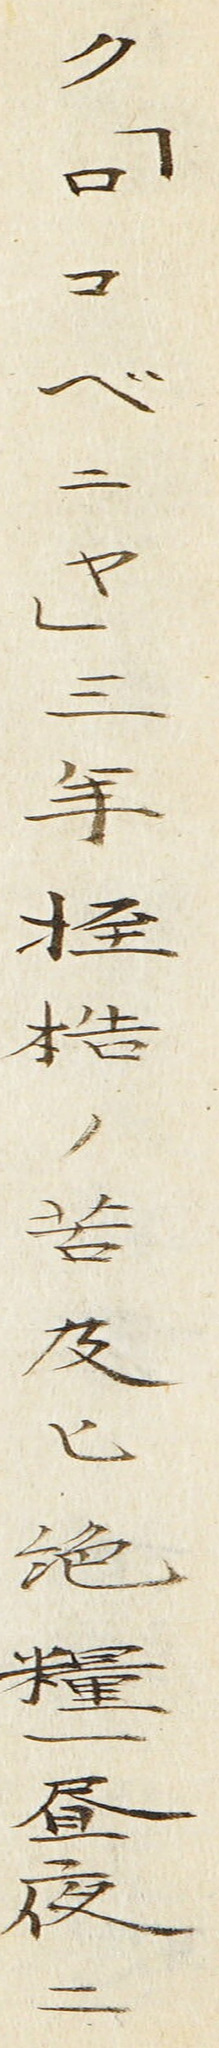ク「ロコベニヤ」三年桎梏ノ苦及ヒ絶糧一昼夜ニ
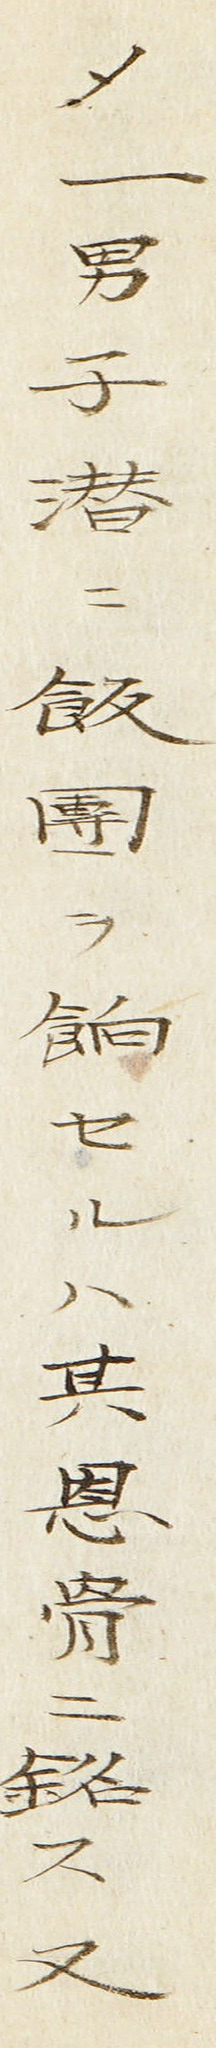シテ一男子潜ニ飯団ヲ餉セルハ其恩骨ニ銘ス又
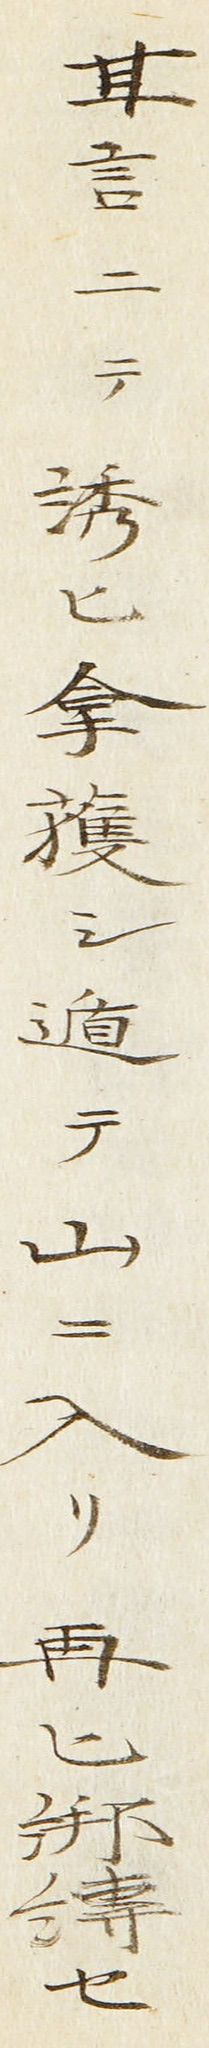甘言ニテ誘ヒ拿獲シ遁テ山ニ入リ再ヒ綁縛セ
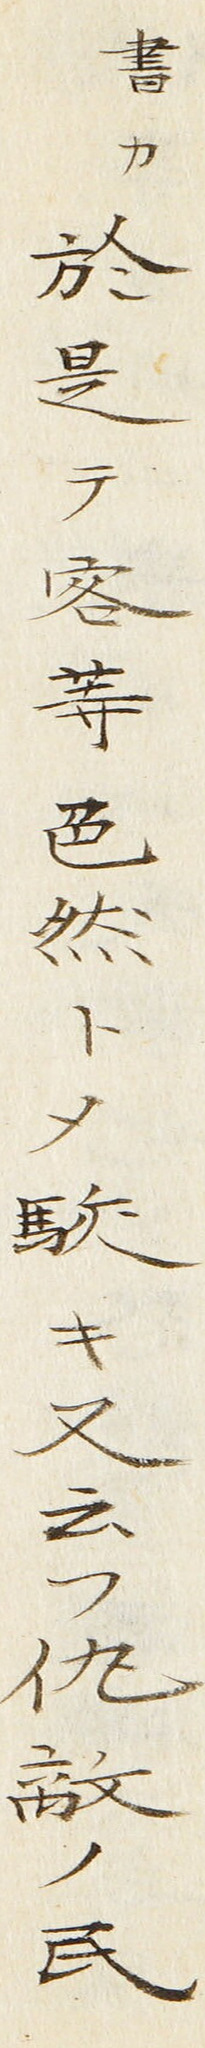書ヵ於是テ客等色然トシテキ又云フ仇歒ノ民
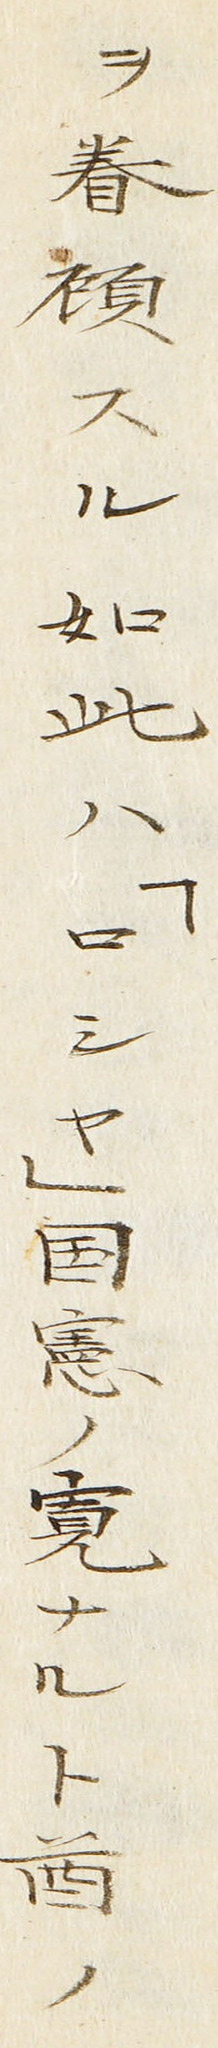ヲ眷顧スル如此ハ「ロシヤ」国憲ノ寛ナルト酋ノ
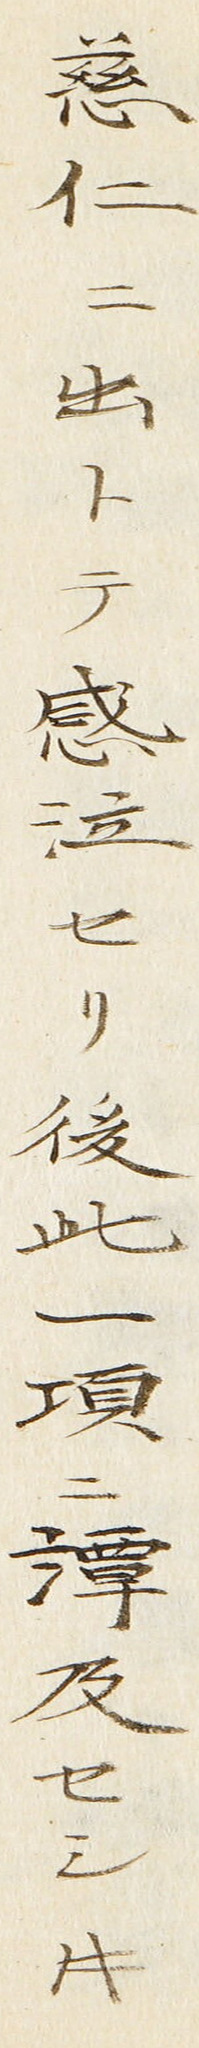慈仁ニ出トテ感泣セリ後此一項ニ譚及セシトキ
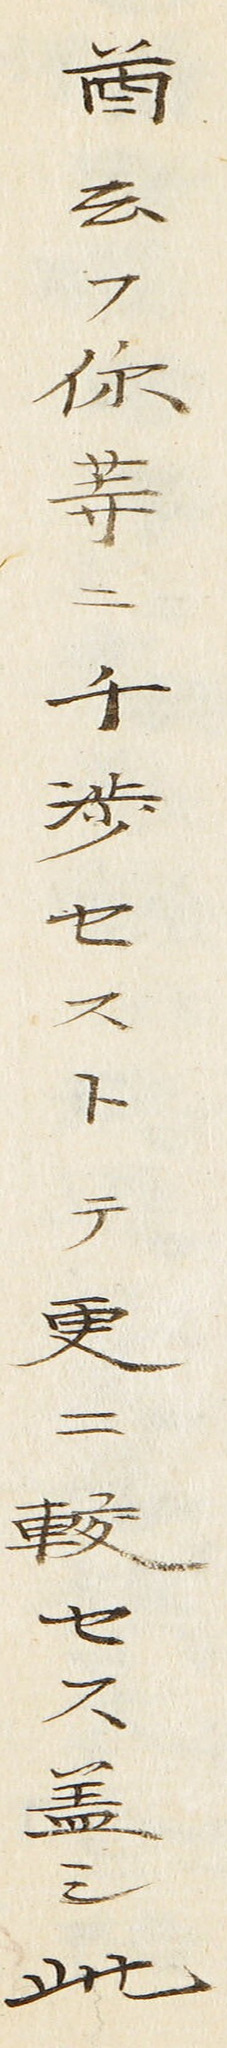酋云フ你等ニ干渉セストテ更ニ較セス蓋シ此
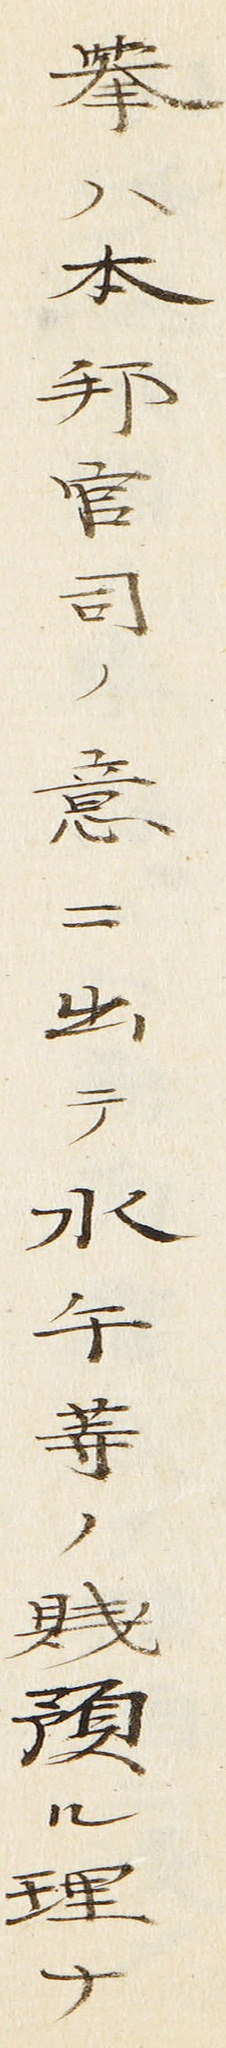拳ハ本邦官司ノ意ニ出テ水午等ノ賎預ル理ナ
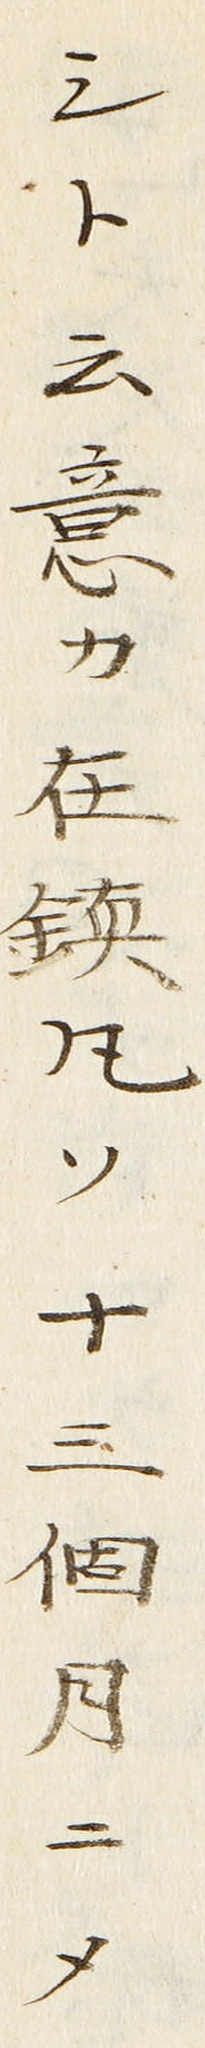シト云意カ在鎮凡ソ十三個月ニシテ
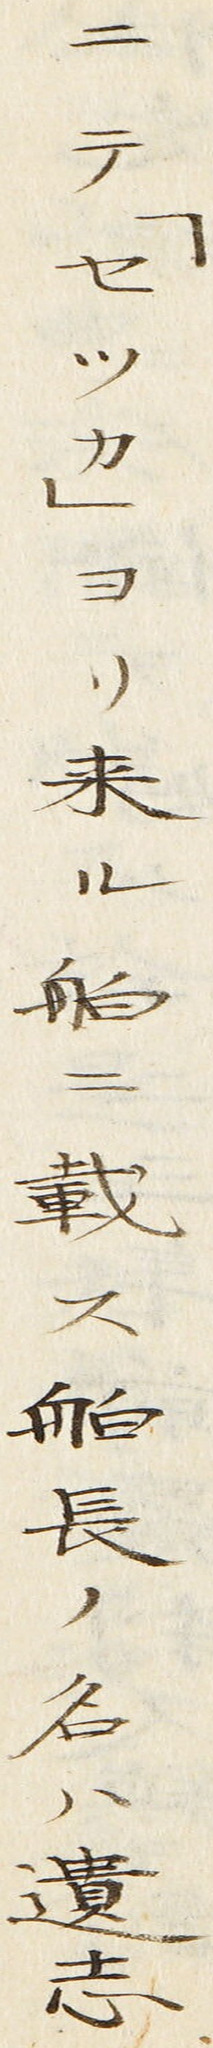ニテ「セツカ」ヨリ来ル舶ニ載ス舶長ノ名ハ遺志
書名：流蕃通書
